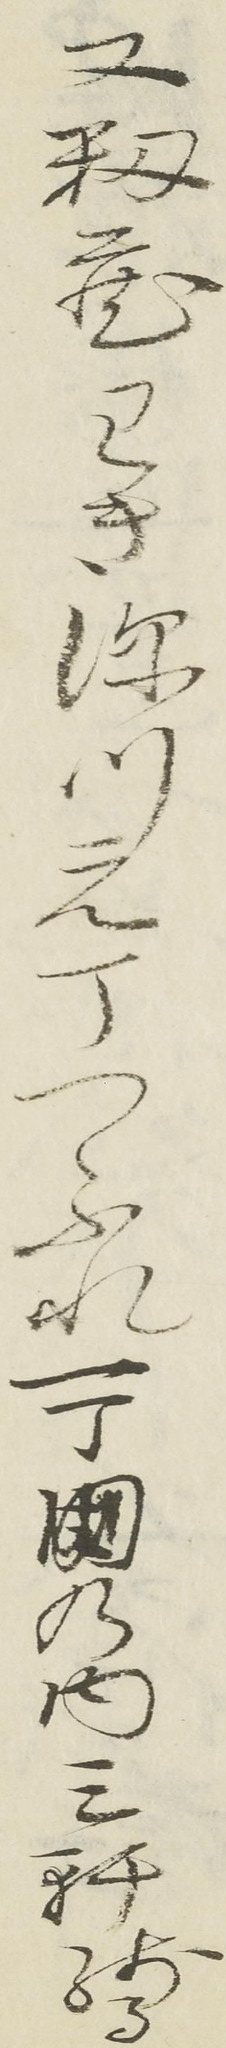又籾蔵わき深川元丁つふれ一丁の内三軒残る
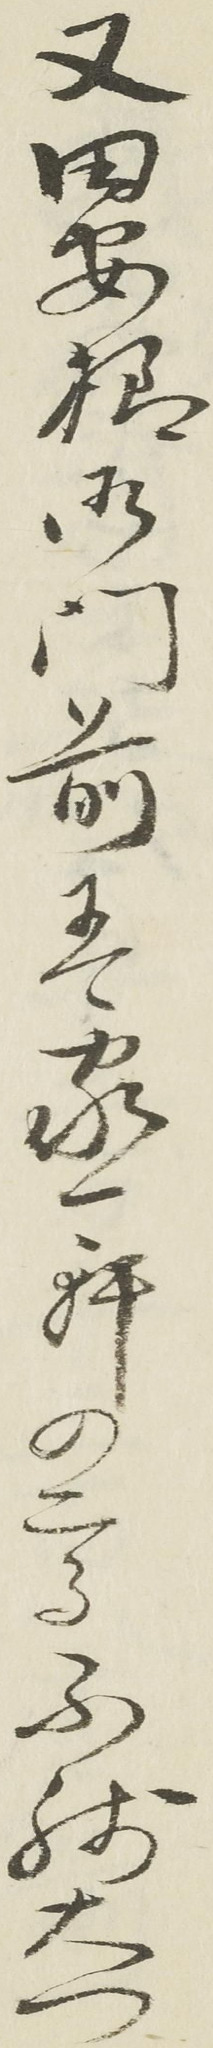又田安様御門前ニて家一軒のこる不残大つ
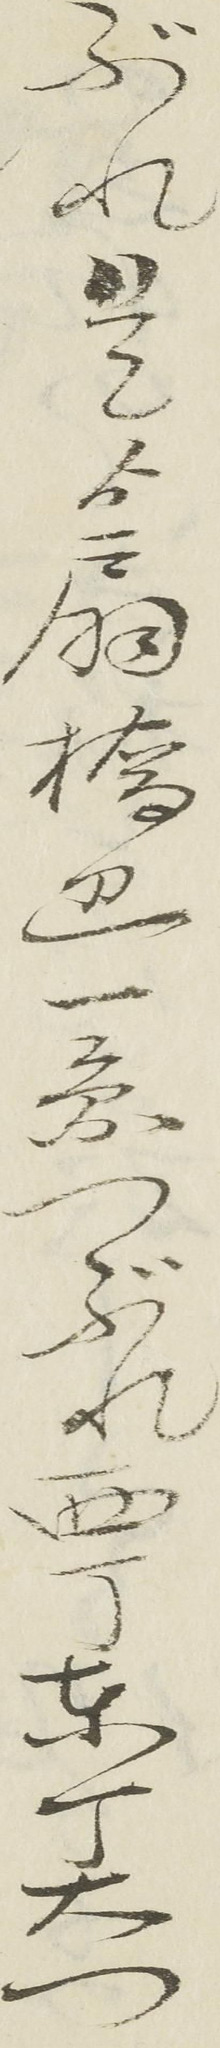ぶれ是ゟ扇橋辺一圓つぶれ西丁東丁大つ
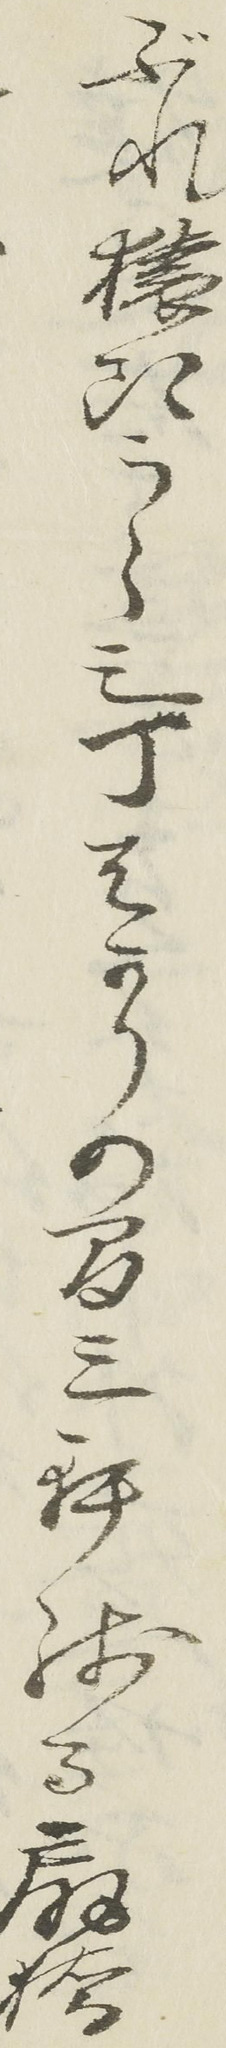ぶれ猿頭うら三丁はかりの間三軒残る扇橋
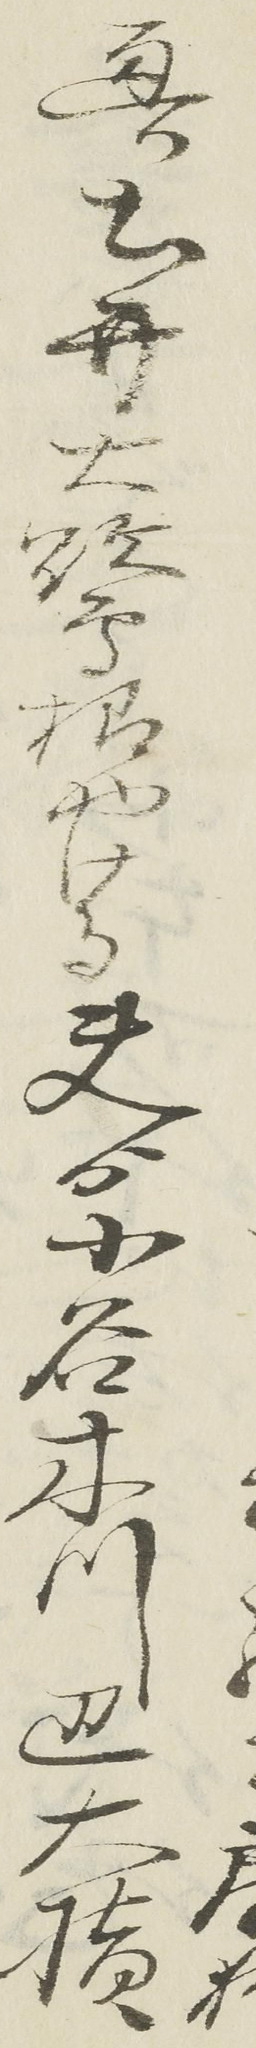通り土井大炊守様やける夫ゟ小谷木川辺大損
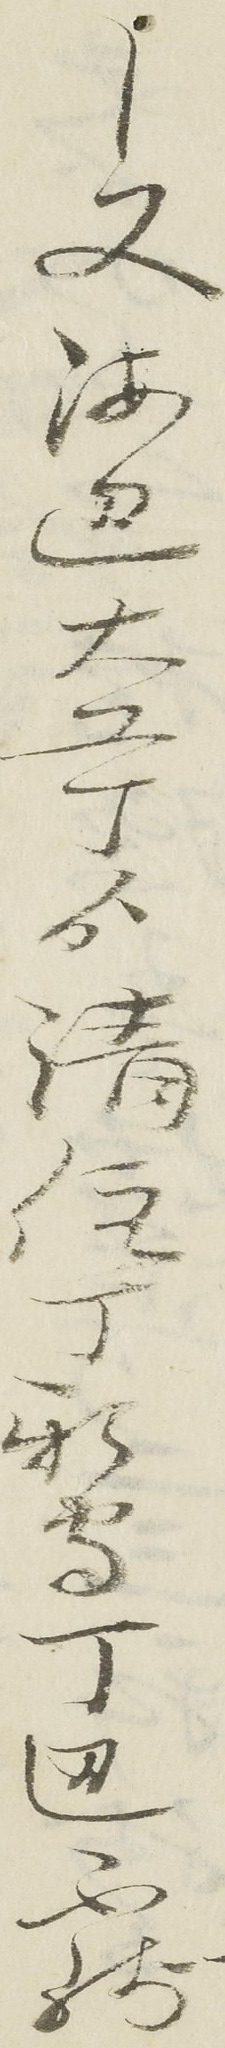し又海辺大工丁ゟ清住丁新寺丁辺不残
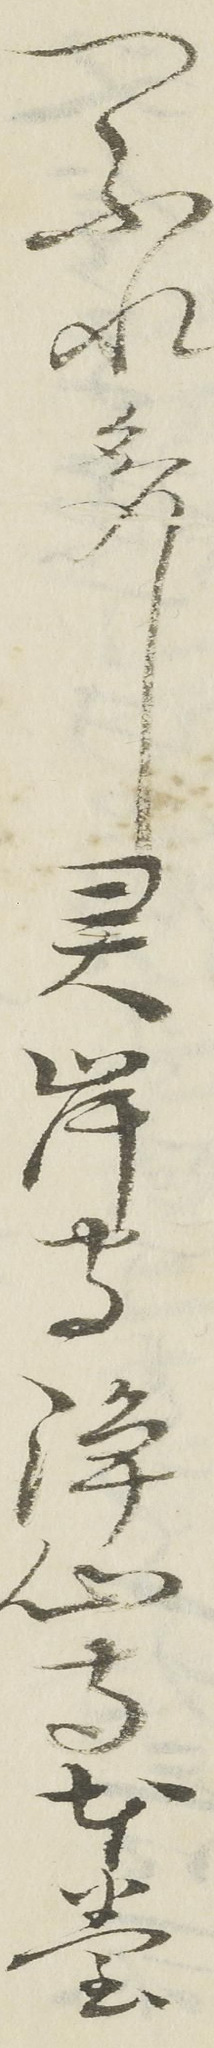つふれ多し霊岸寺浄心寺本堂
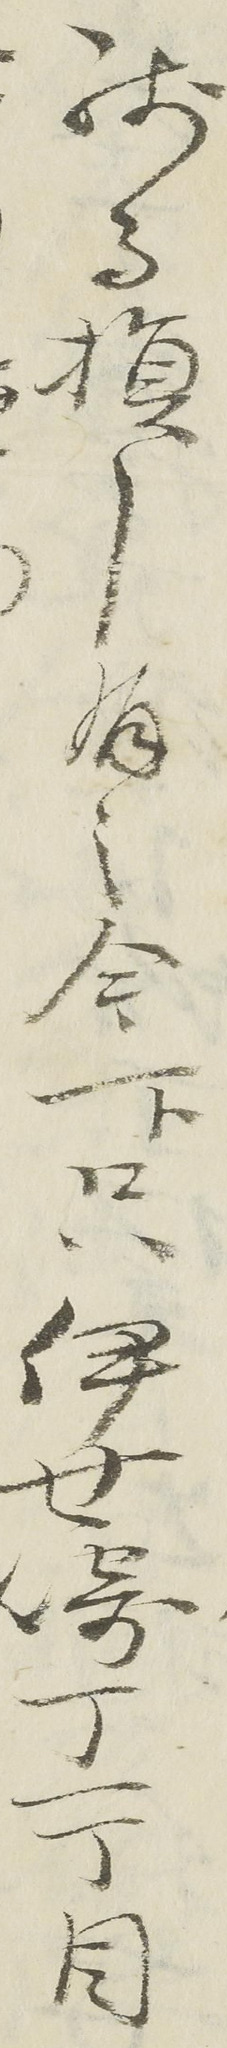残る損し有之今一ト口ハ伊せ崎丁一丁目
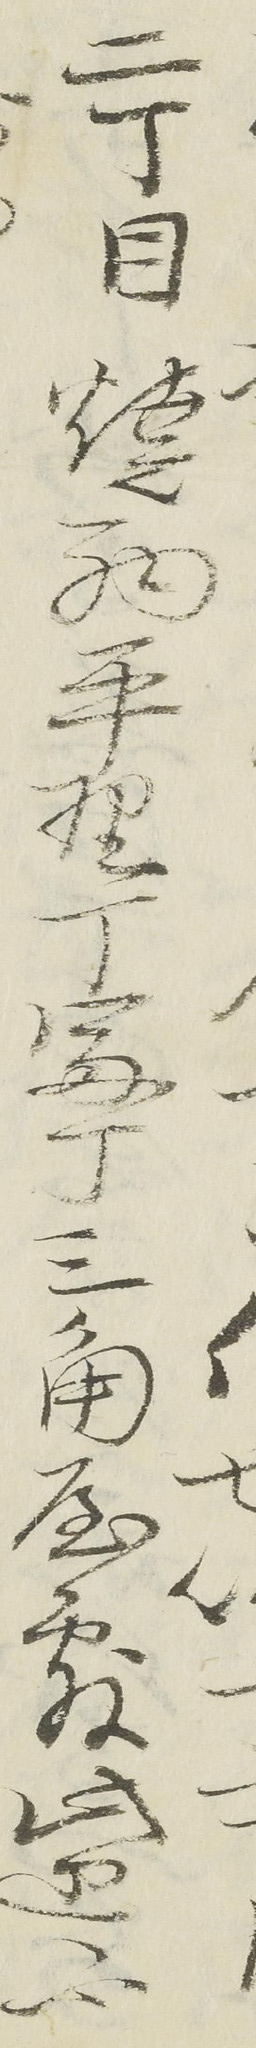二丁目焼西平野丁富丁三角屋敷此辺不
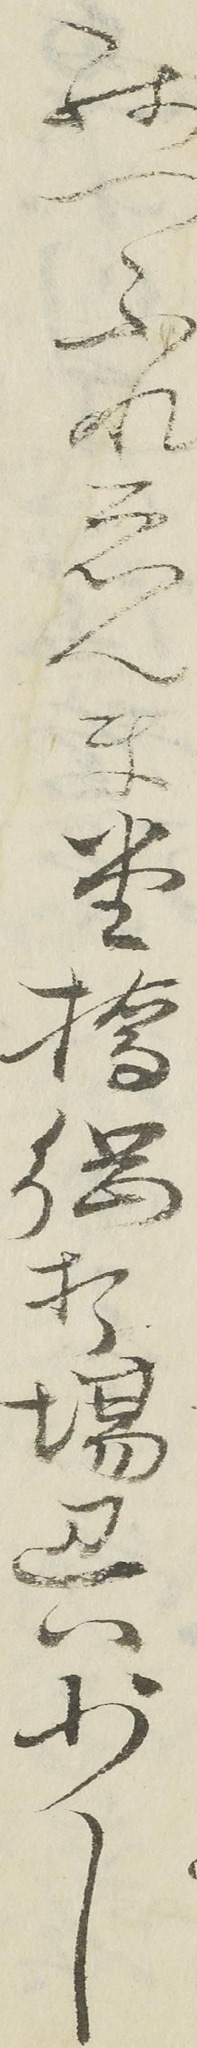残つふれゑんま堂橋端綱打場辺ハ少し
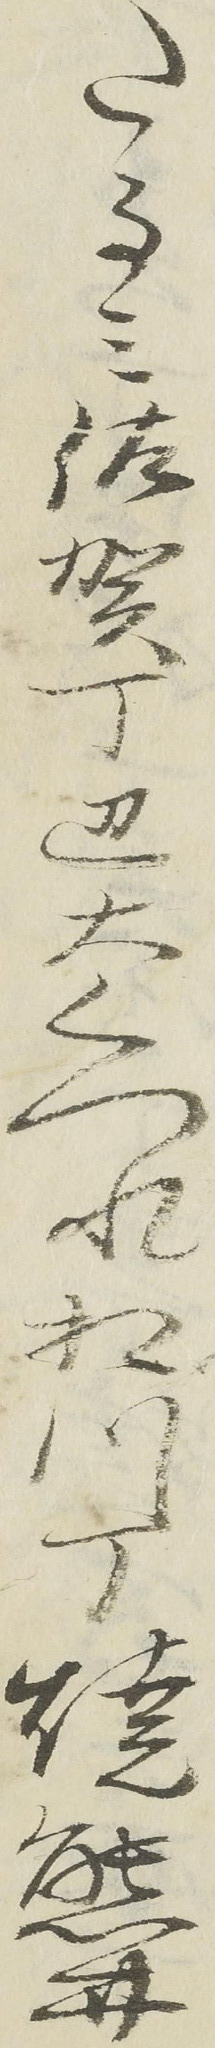たるミ佐賀丁辺大くつれ相川丁焼熊井

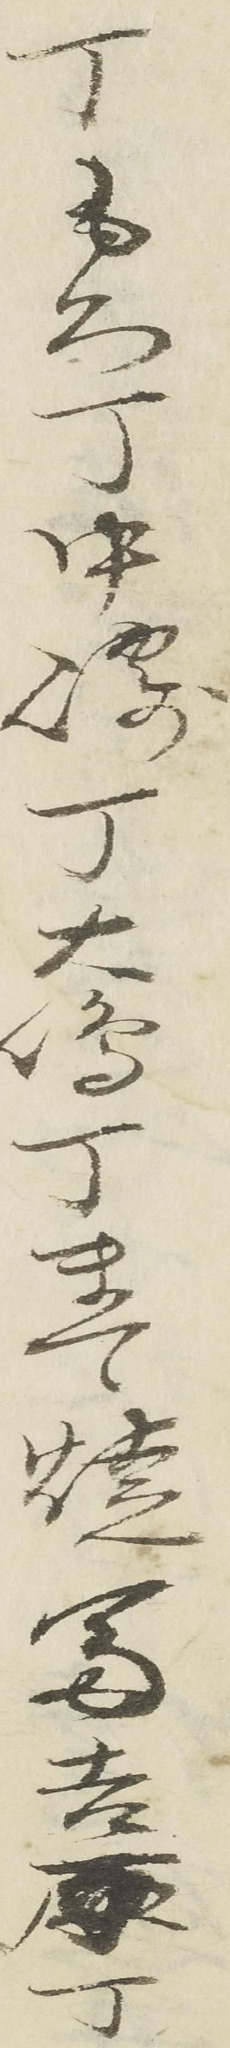丁もろ丁中崎丁大嶋丁まて焼富吉丁
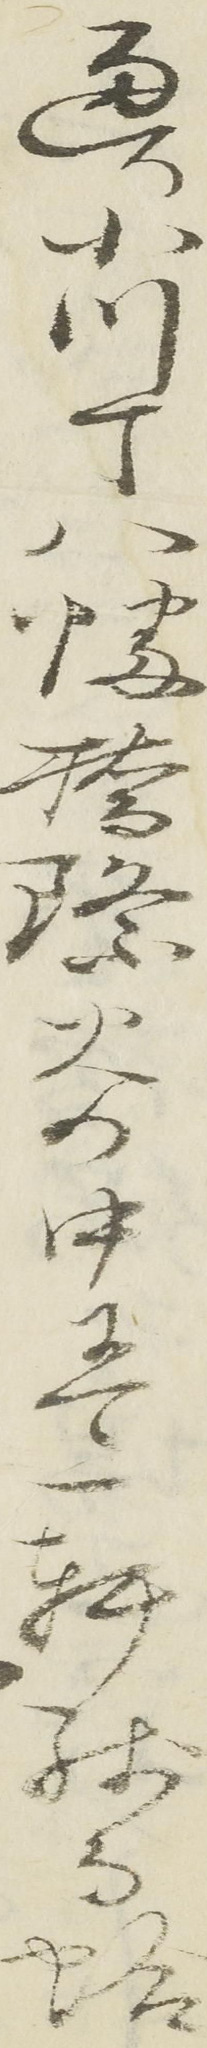通り小川丁八幡橋際火の中ニて一軒残る蛤
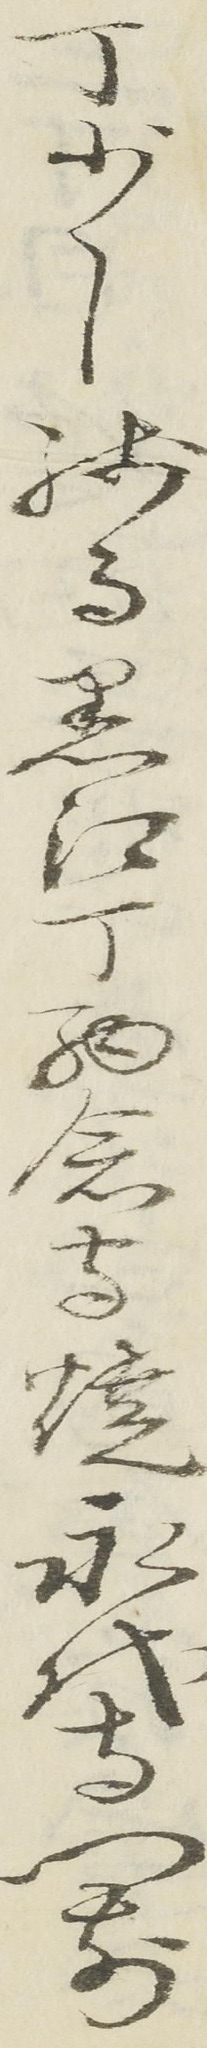丁少し残る黒江丁西念寺焼永代寺門前
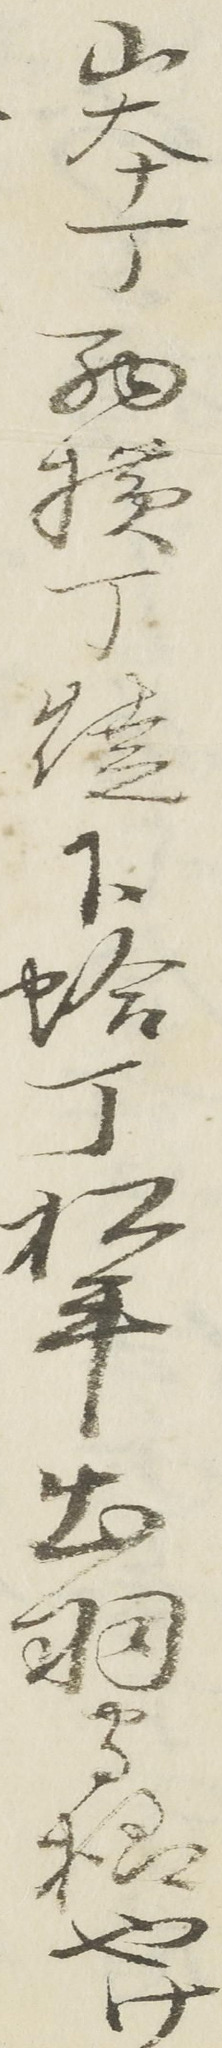山本丁西横丁焼下蛤丁松平出羽守様やけ
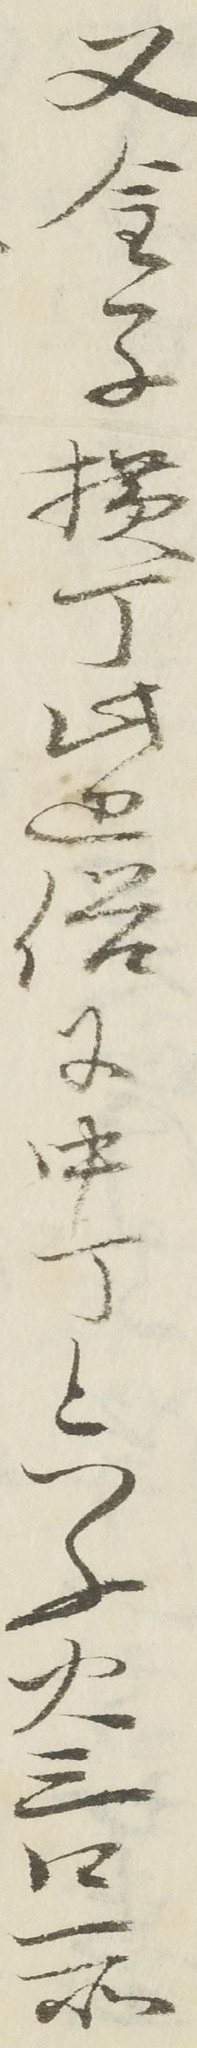又金子横丁此辺俗に中丁といふ火三口一所
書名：安政乙卯江戸大地震筆記　安政丙辰八月大阪大雷雨之記追加　安政三辰年七月松前辺大地震并八月大風雨記録
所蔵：東京大学地震研究所図書室 Earthquake Research Institute Library, The University of Tokyo, JAPAN
